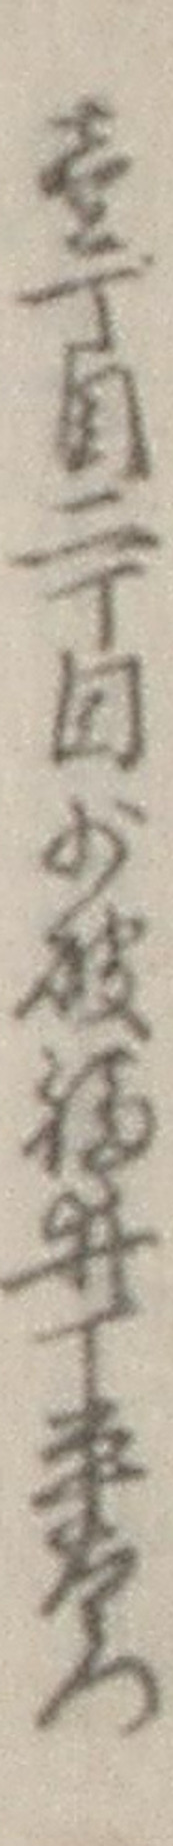壱丁目二丁目少破損井丁平右衛門
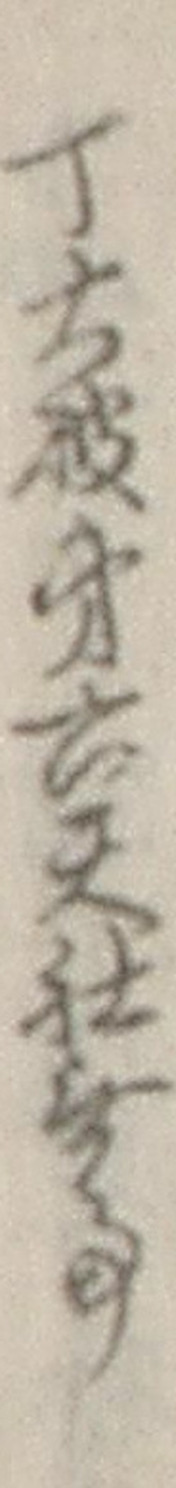丁大破弟六天社無事
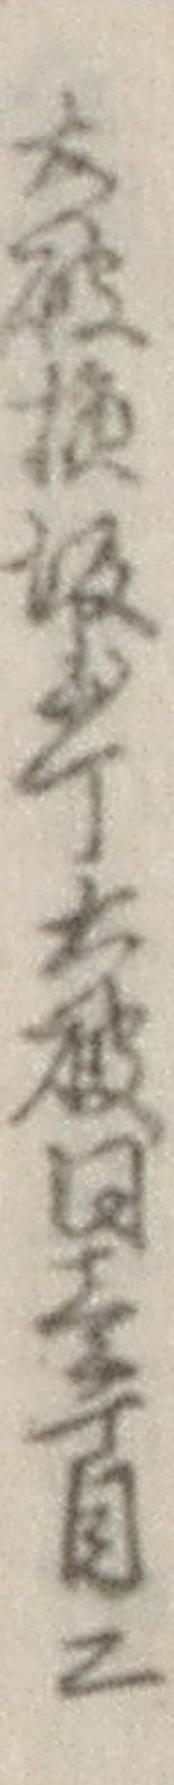大破損坂出丁大破同幸一丁目二
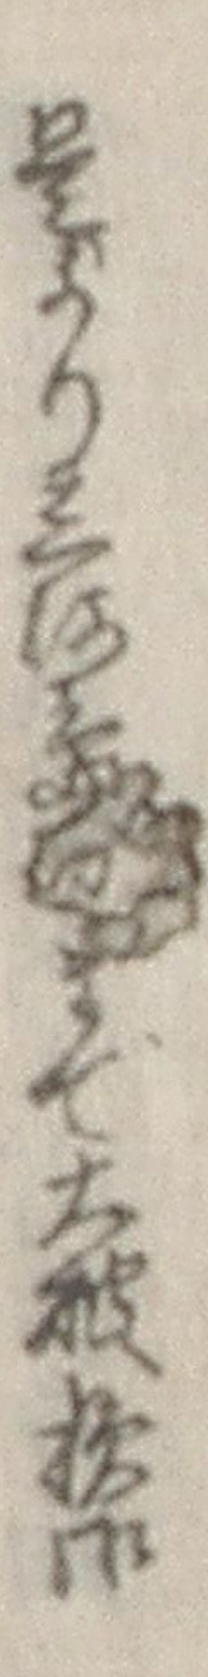是より三河島辺まで大破損御
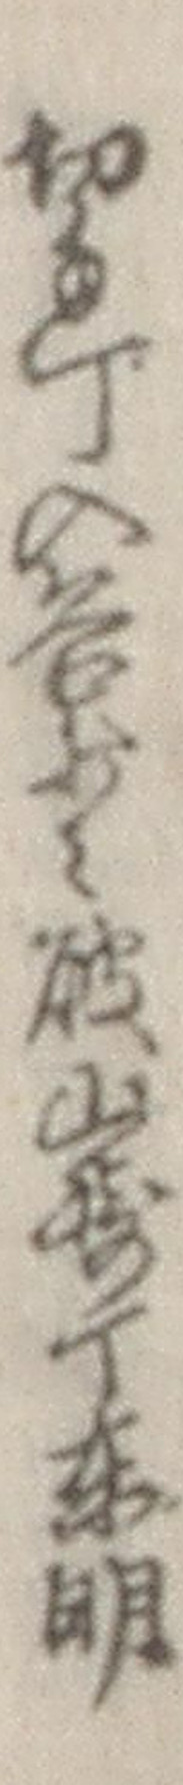切手丁入谷少〻破山崎丁東明
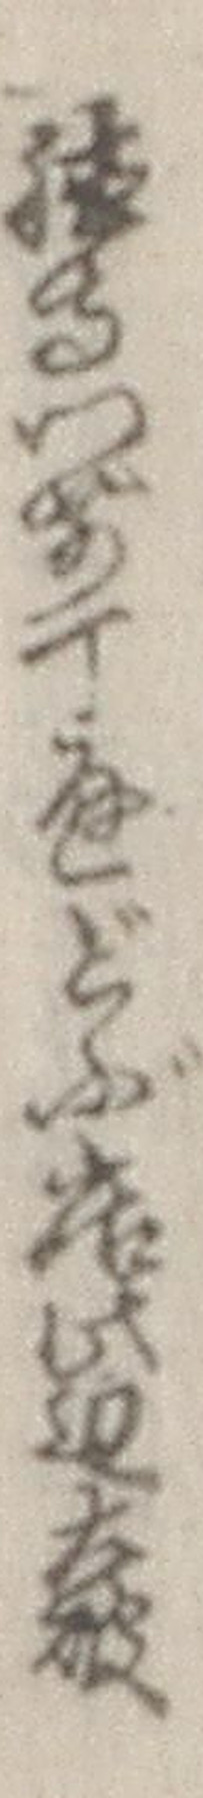徳寺門前丁通どぶ店此辺大破
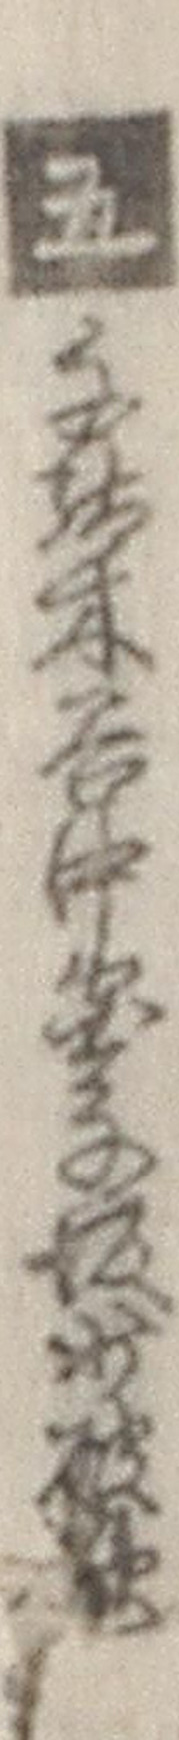五千駄木谷中団子坂少破損
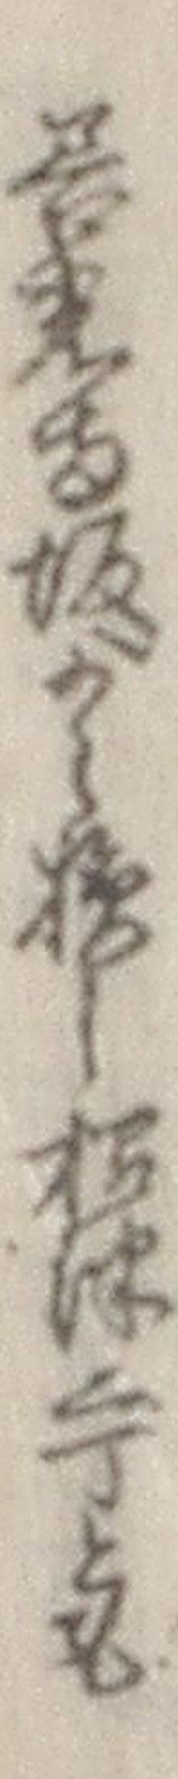善光寺坂少々損し根津二丁とも
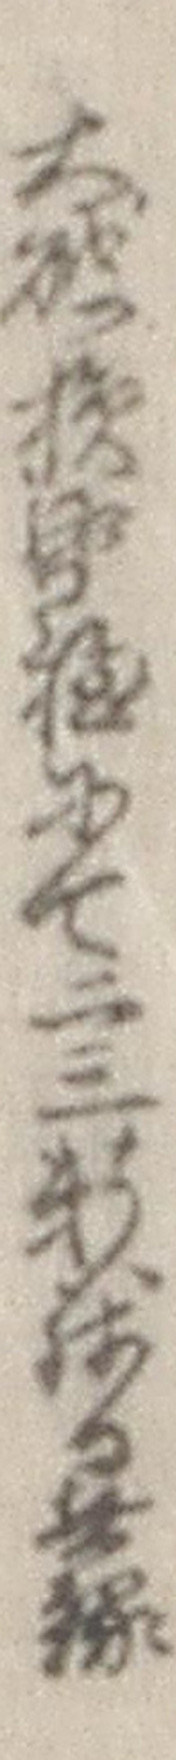大破損申程にて二三軒残る無縁
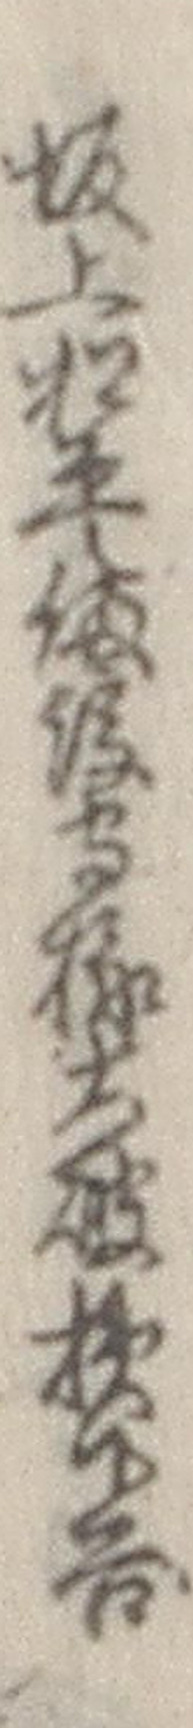坂上松平備後守様大破損下谷
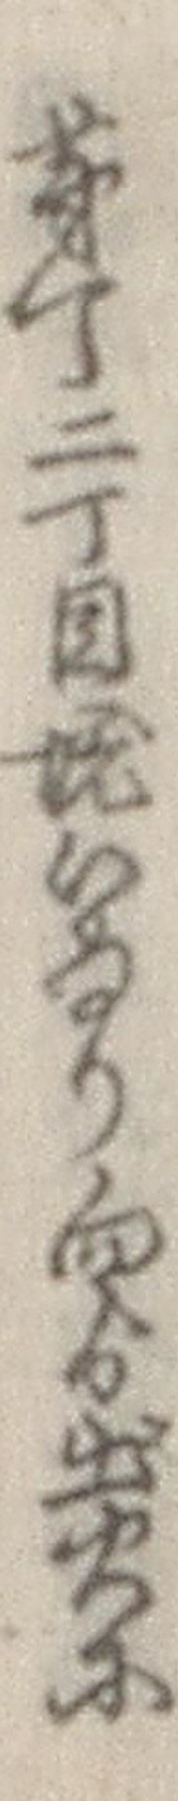茅丁二丁目娩いなり向ゟ出火に
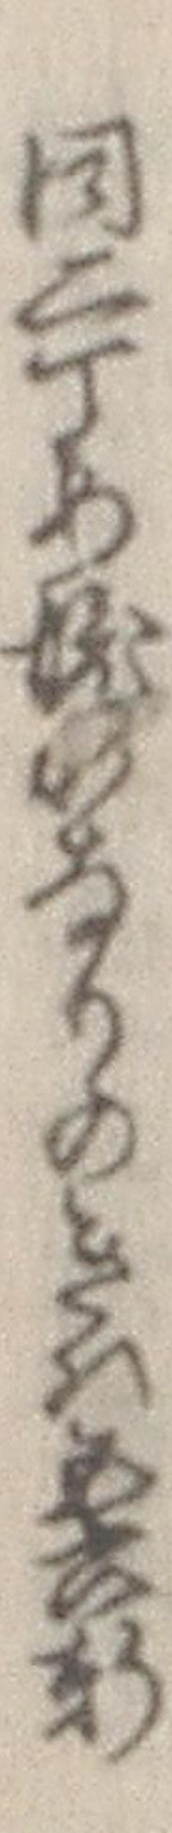同二丁め娩いなりのきは五六軒
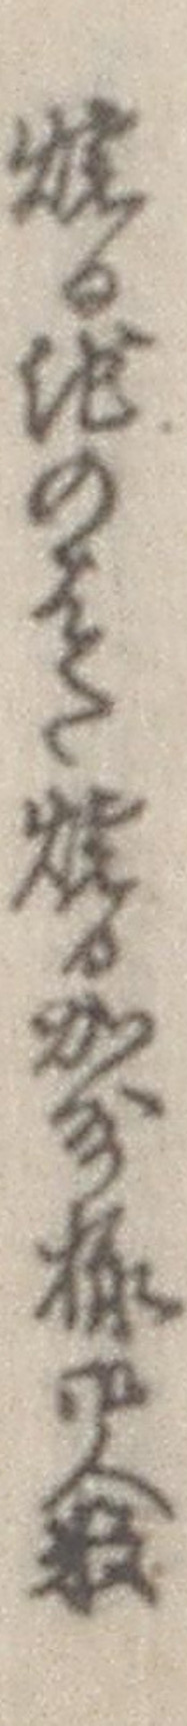焼る地のはた焼る加藤様御人数
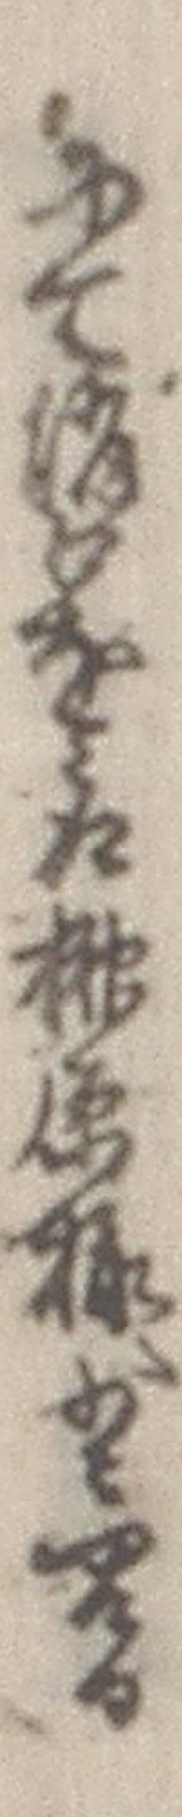にて消け懸取柳原様少〻やける
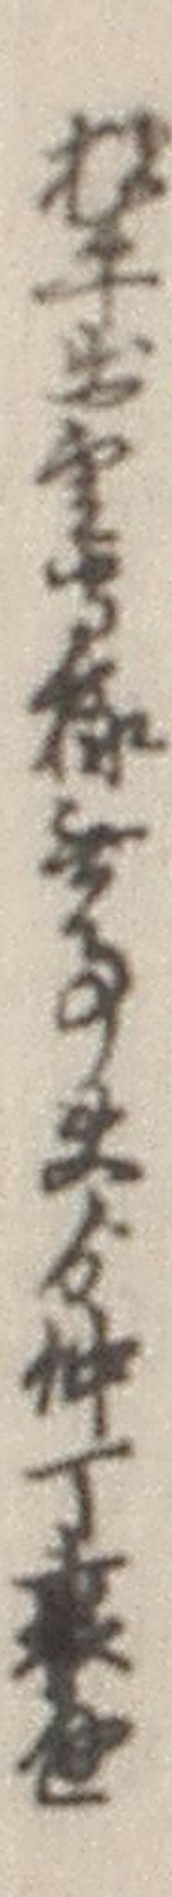松平出雲守様無事夫ゟ仲丁裏通
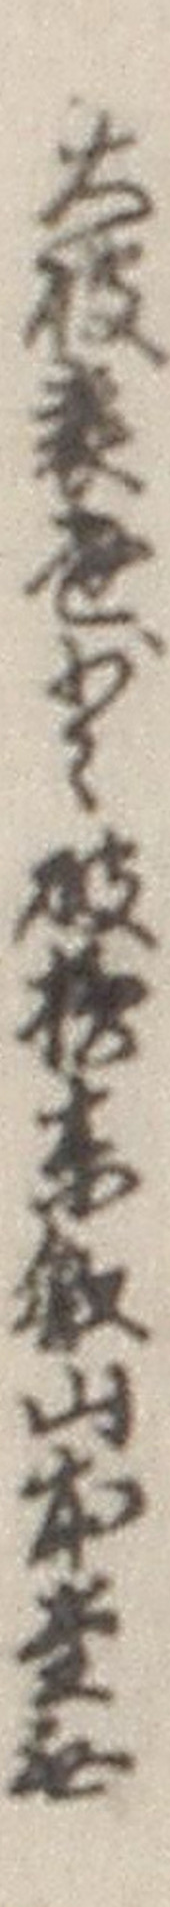大破表通少〻破損東叡山本堂無
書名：江戸　大地震臣細録　全
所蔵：東京大学地震研究所図書室 Earthquake Research Institute Library, The University of Tokyo, JAPAN
